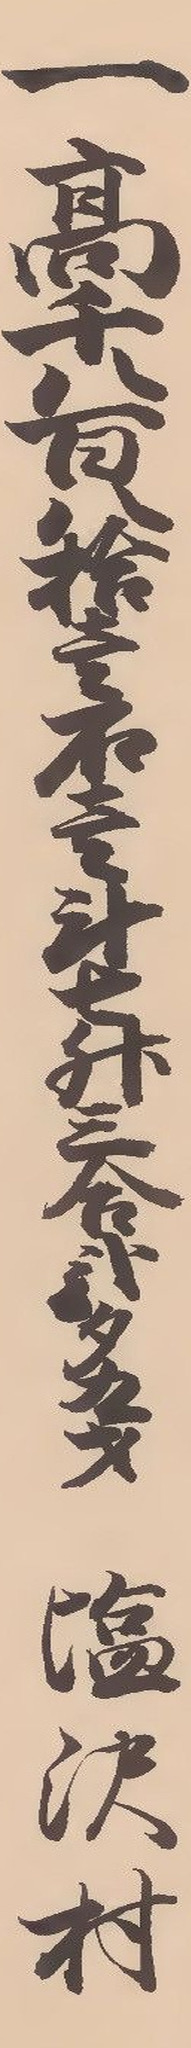一高千八百八拾壱石壱斗七升三合弐勺九才塩沢村
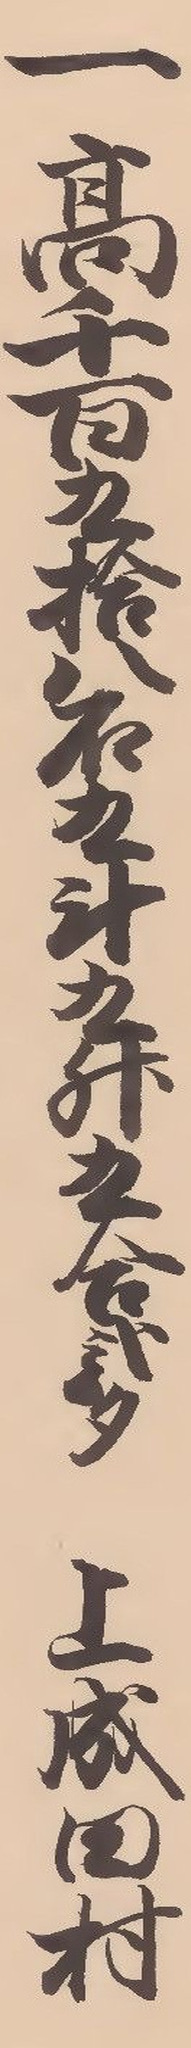一高千百九拾八石九斗九升九合弐勺上成田村
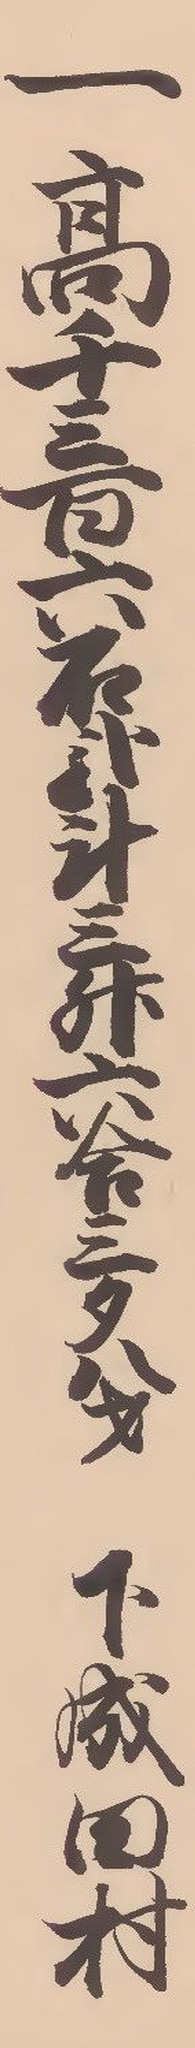一高千三百六石弐斗三升六合三勺八才下成田村

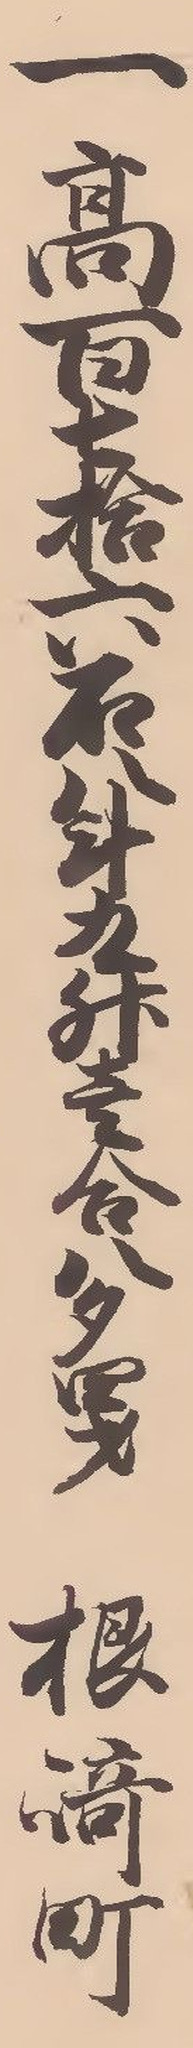一高百七拾六石八斗九升壱合八勺四才根崎町
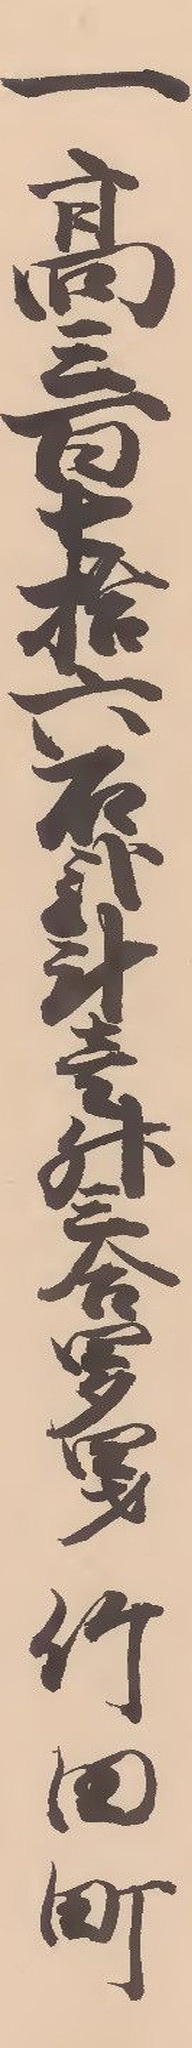一高三百七拾六石弐斗壱升三合四勺四才竹田町
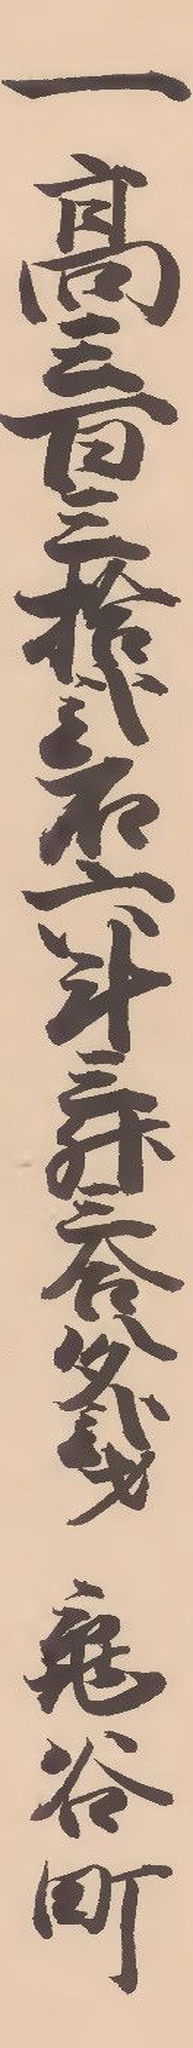一高三百三拾弐石六斗三升三合八勺弐才亀谷町
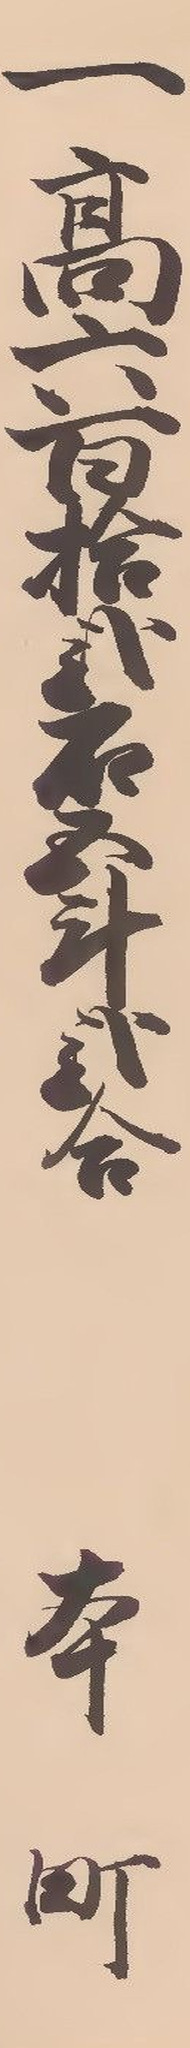一高六百拾弐石五斗弐合本町
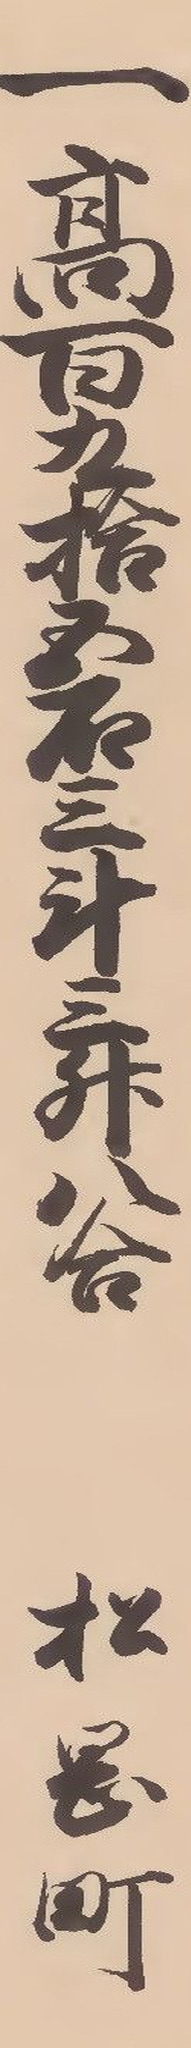一高百九拾五石三斗三升八合松岡町
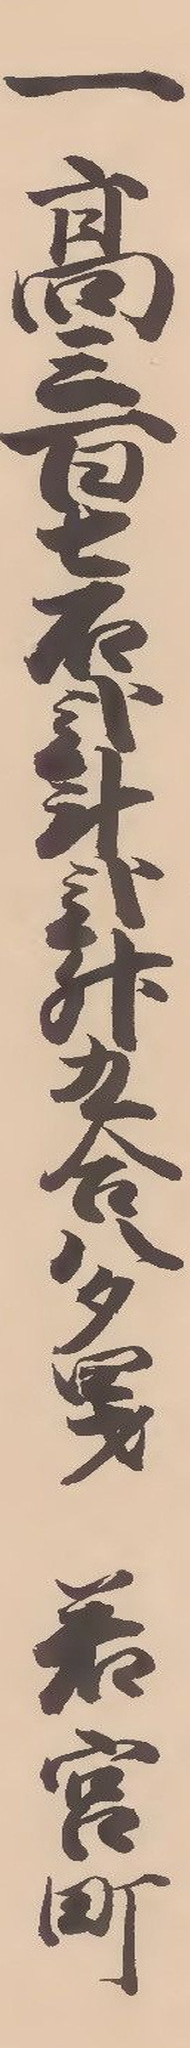一高三百七石弐斗弐升九合八勺四才若宮町
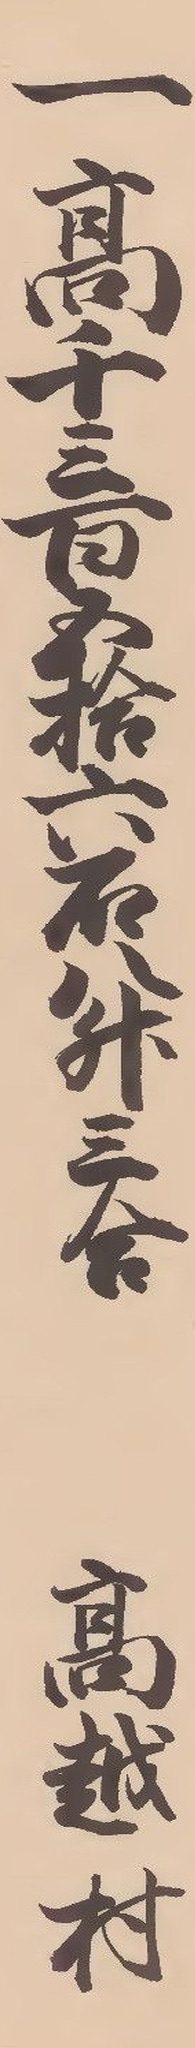一高千三百五拾六石八升三合高越村
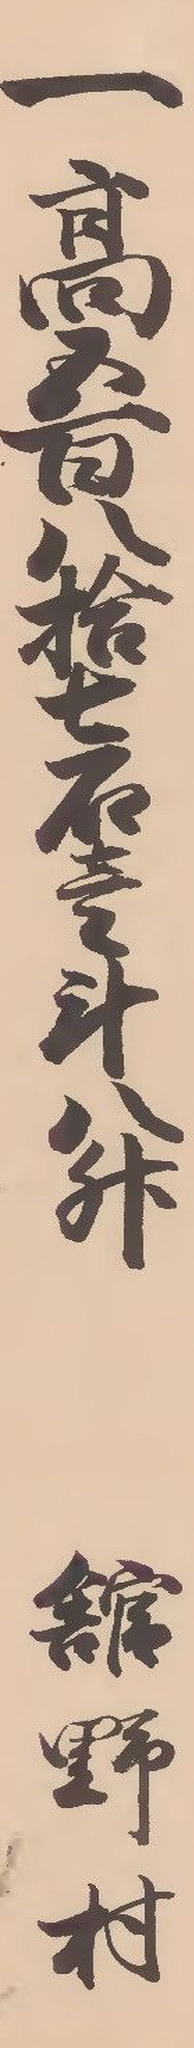一高五百八拾七石壱斗八升館野村

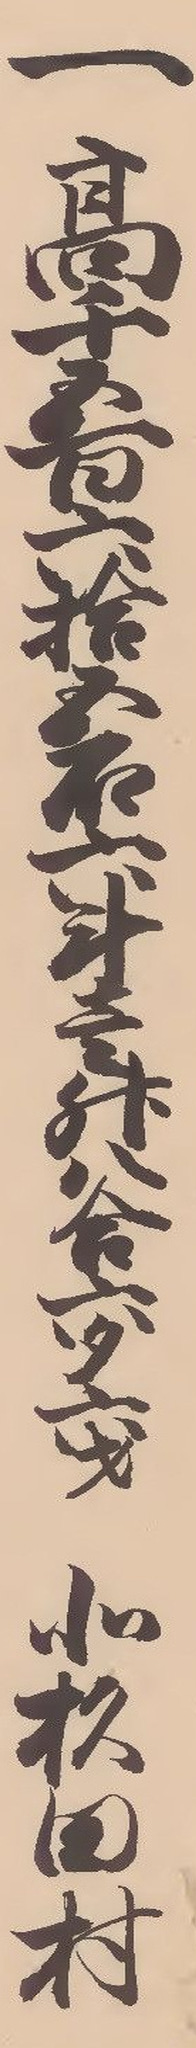一高千五百六拾五石六斗壱升八合六勺六才北杉田村
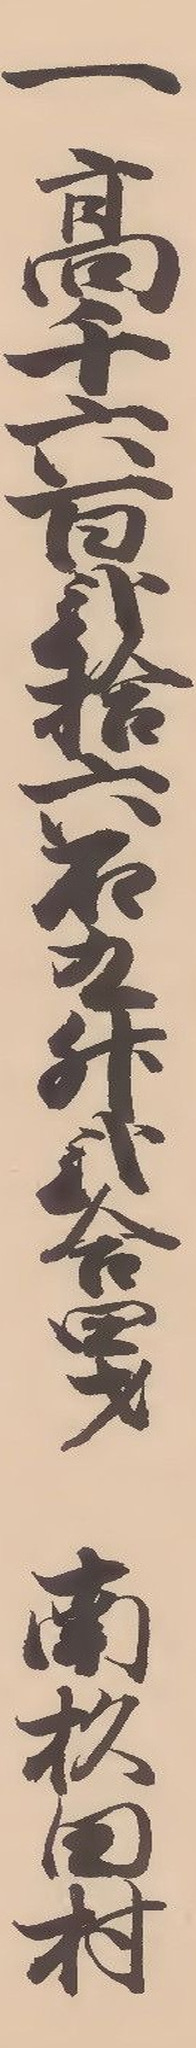一高千六百弐拾六石九升弐合四才南杉田村
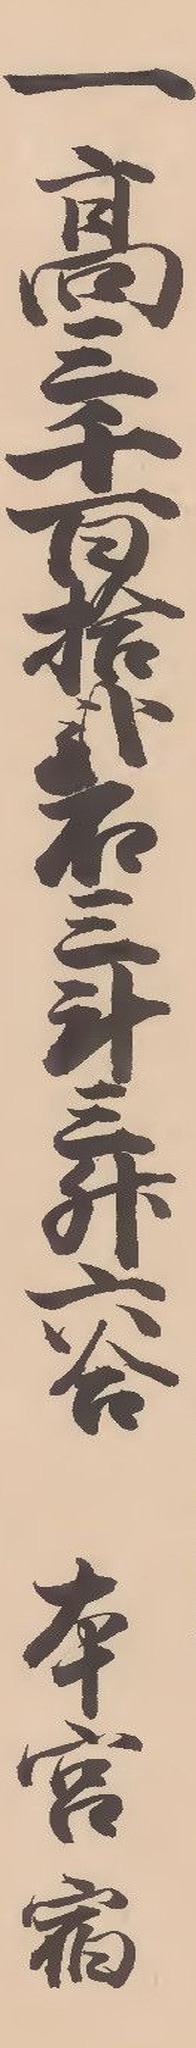一高三千百拾弐石三斗三升六合本宮宿
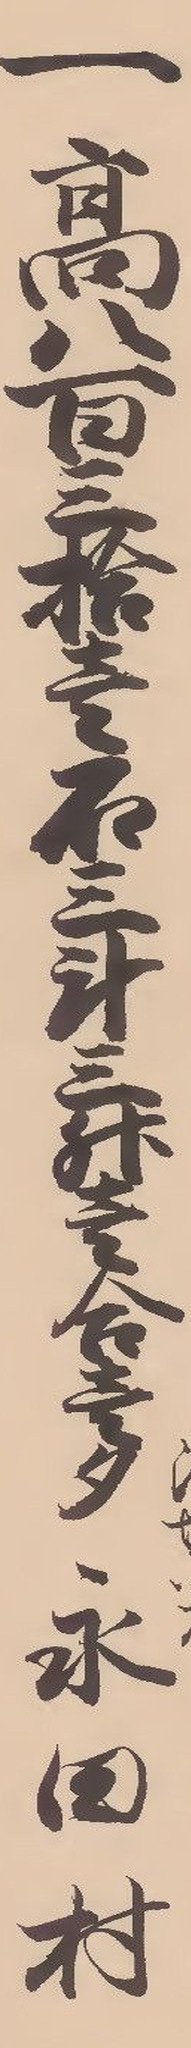一高八百三拾壱石三斗三升壱合壱勺永田村
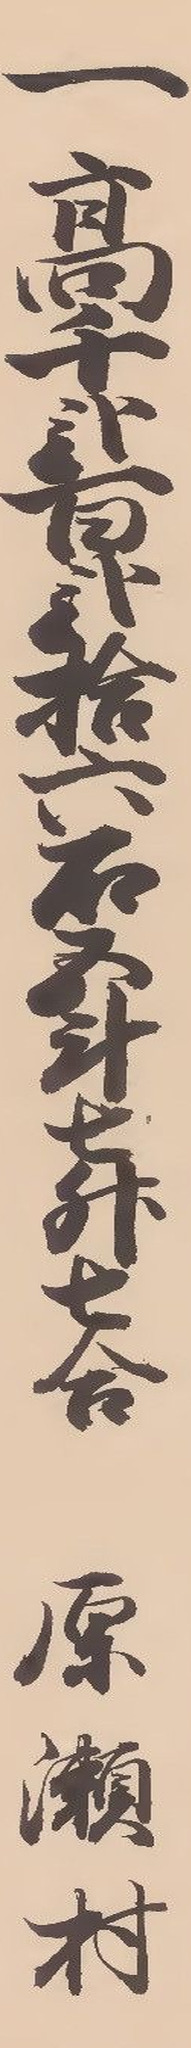一高千弐百弐拾六石五斗七升七合原瀬村
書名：陸奥国郷帳　２
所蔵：国立公文書館 National Archives of Japan
